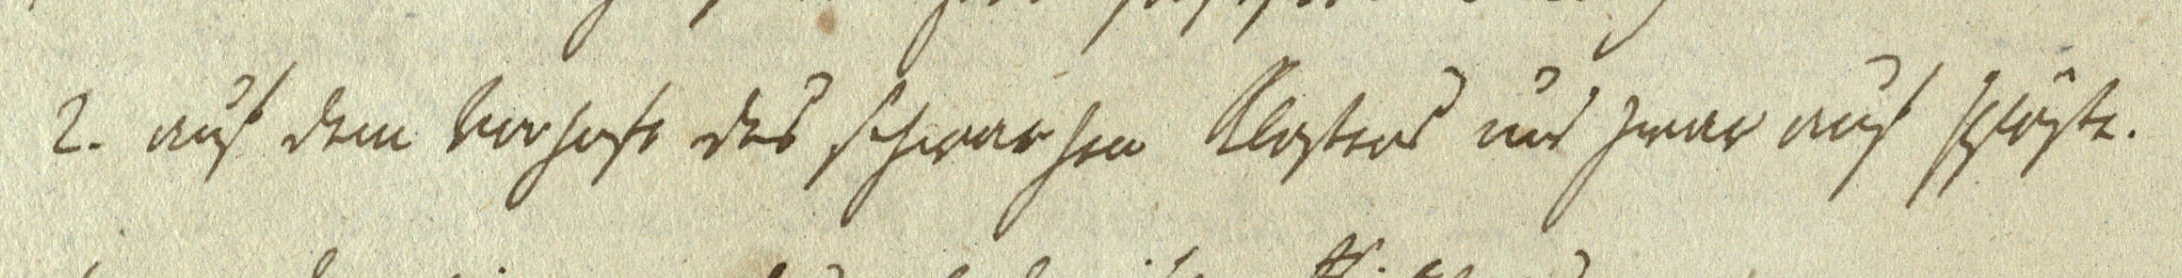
2. auf dem Vorhofe des schwarzen Klosters und zwar auf Pföste.
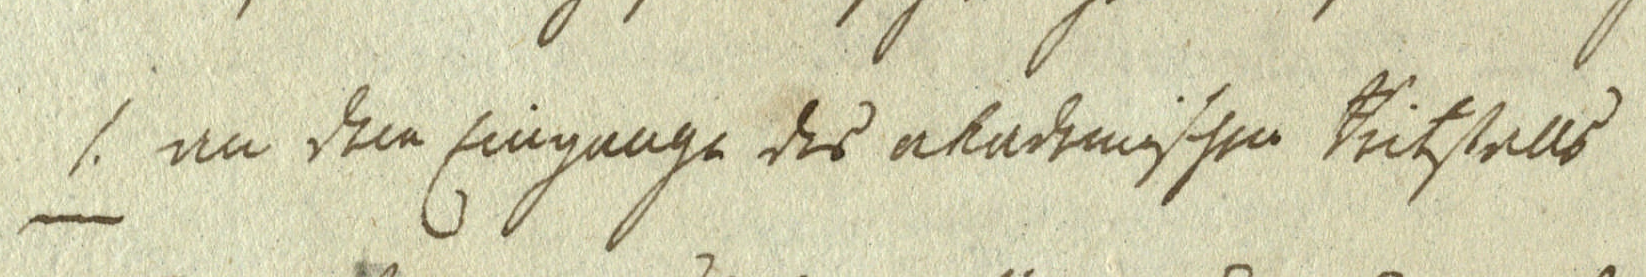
1 an den Eingange des akademischen Reitstalls
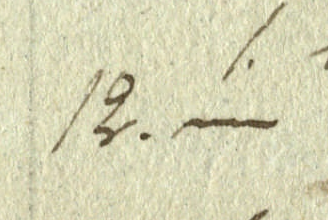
12.
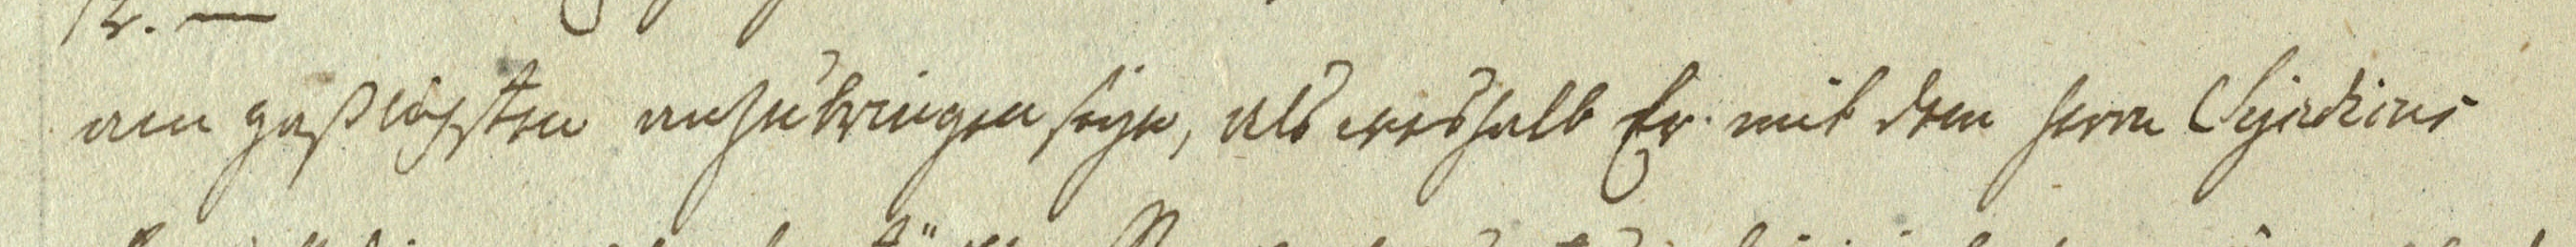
am paßlichsten anzubringen seÿn, als weshalb Er. mit dem Herrn Sÿndicus
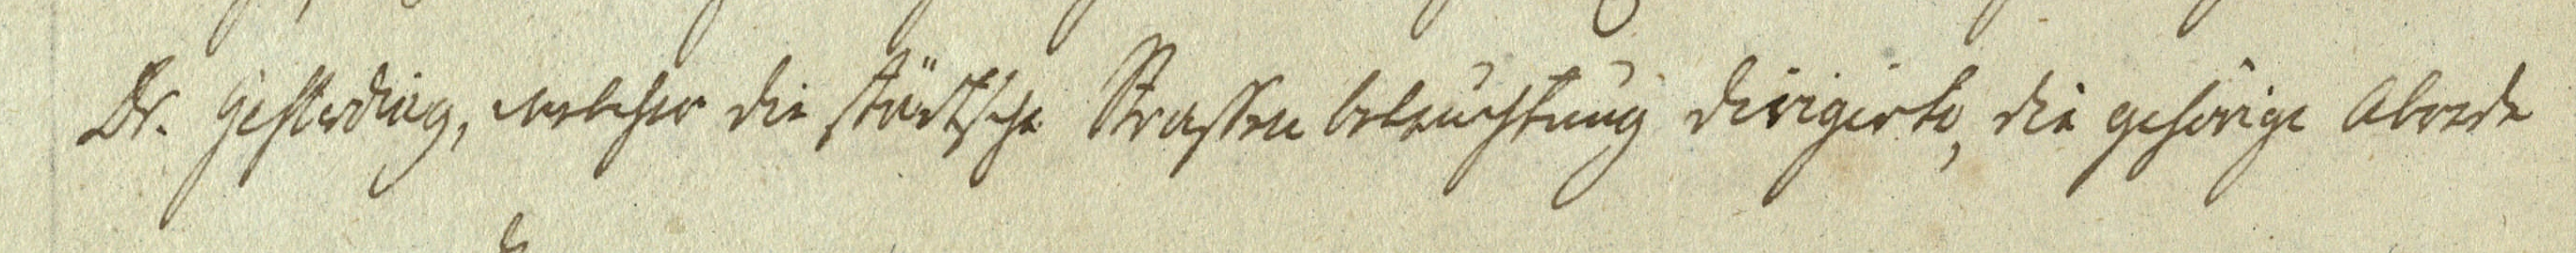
Dr. Gesterding, welcher die städtsche Strassenbeleuchtung dirigirte, die gehörige Abrede
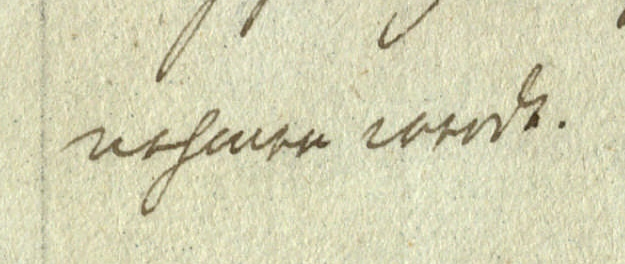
nehmen werde.
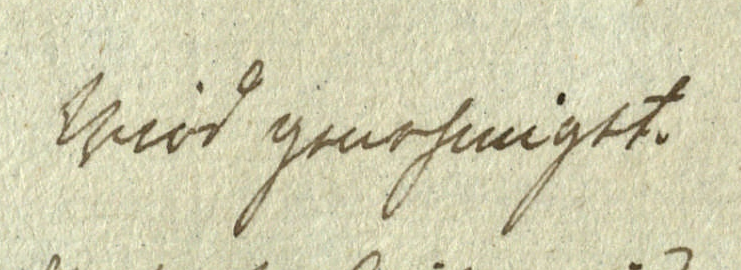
Wird genehmiget.
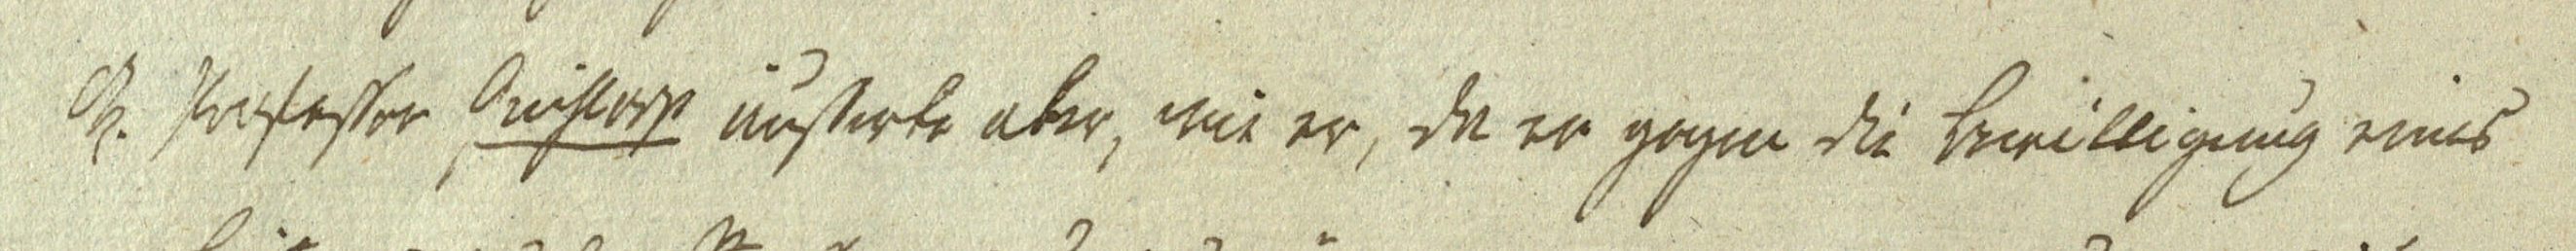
dh. Professor Quistorp äusserte aber, wie er, da er gegen die Bewilligung eines
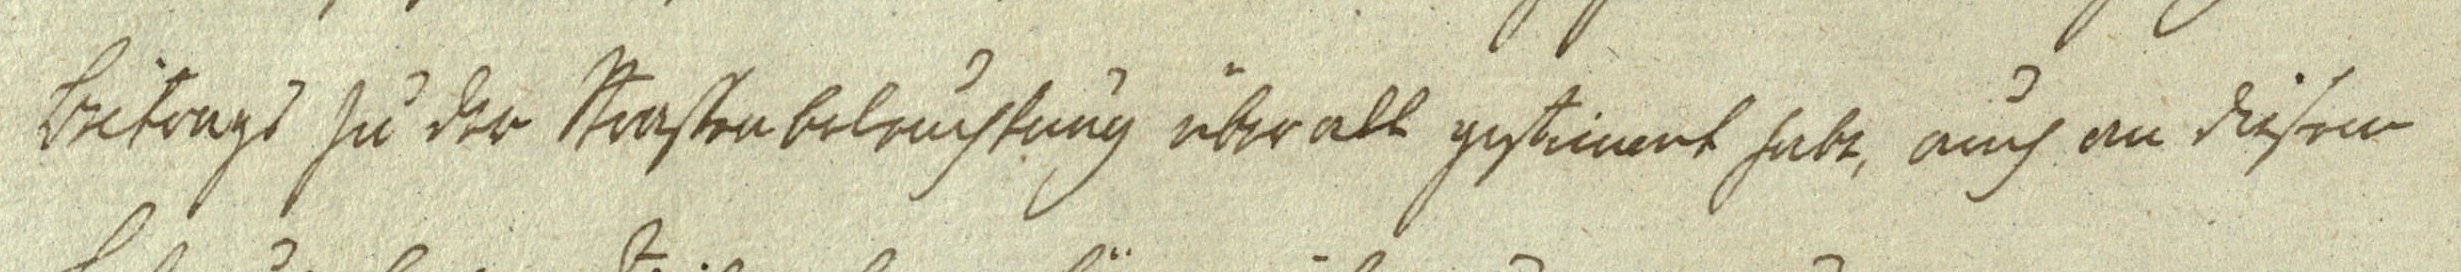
Beitrags zu der Strassenbeleuchtung überall gestimmt habe, auch an diesem
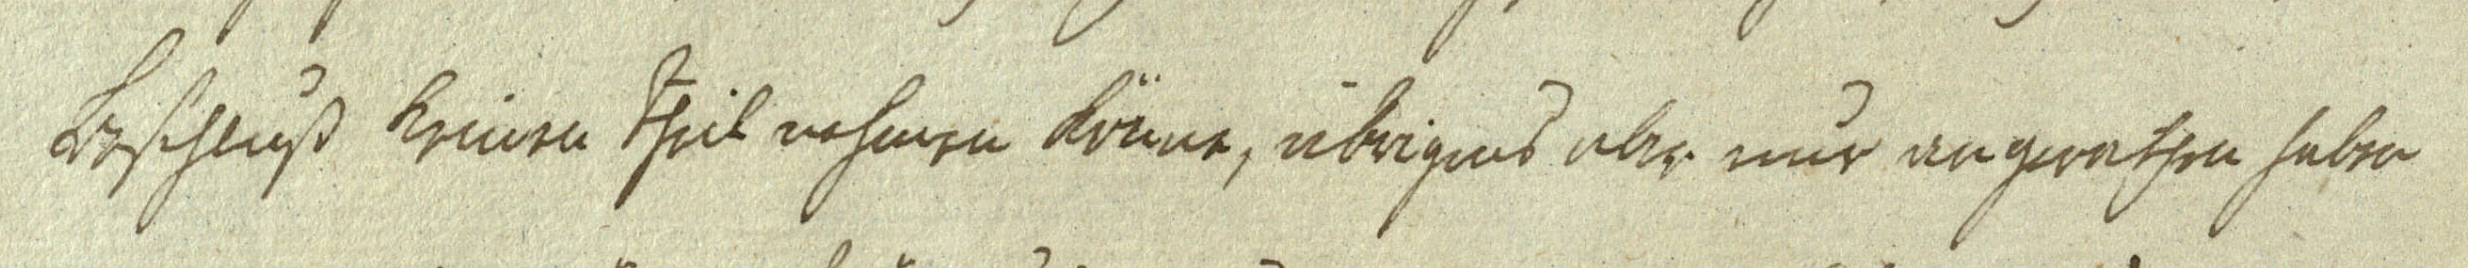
Beschluß keinen Theil nehmen könne, übrigens aber nur angerathen haben
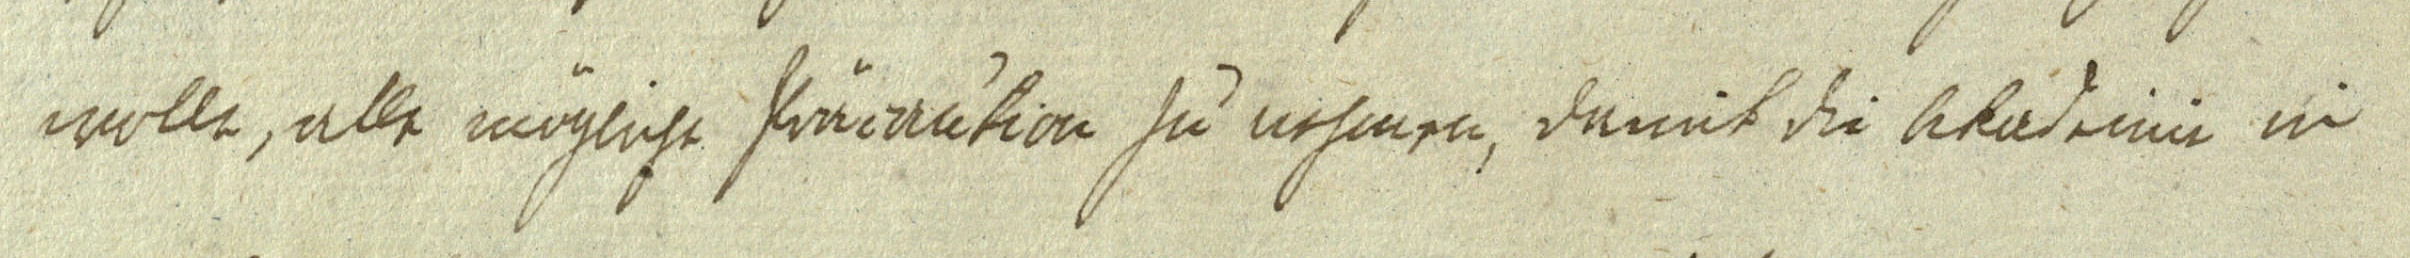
wolle, alle mögliche Präcaution zu nehmen, damit die Akademie in
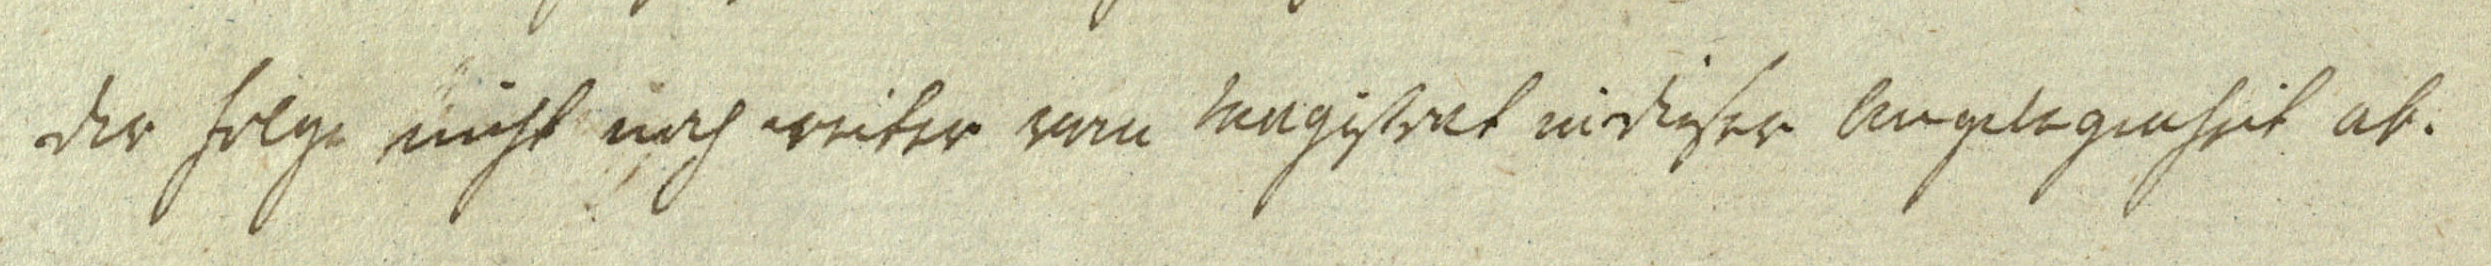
der Folge nicht noch weiter vom Magistrat in dieser Angelegenheit ab¬
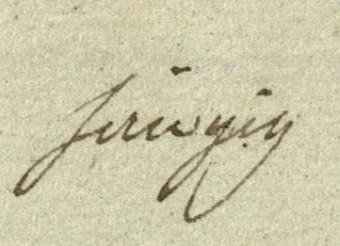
hängig
